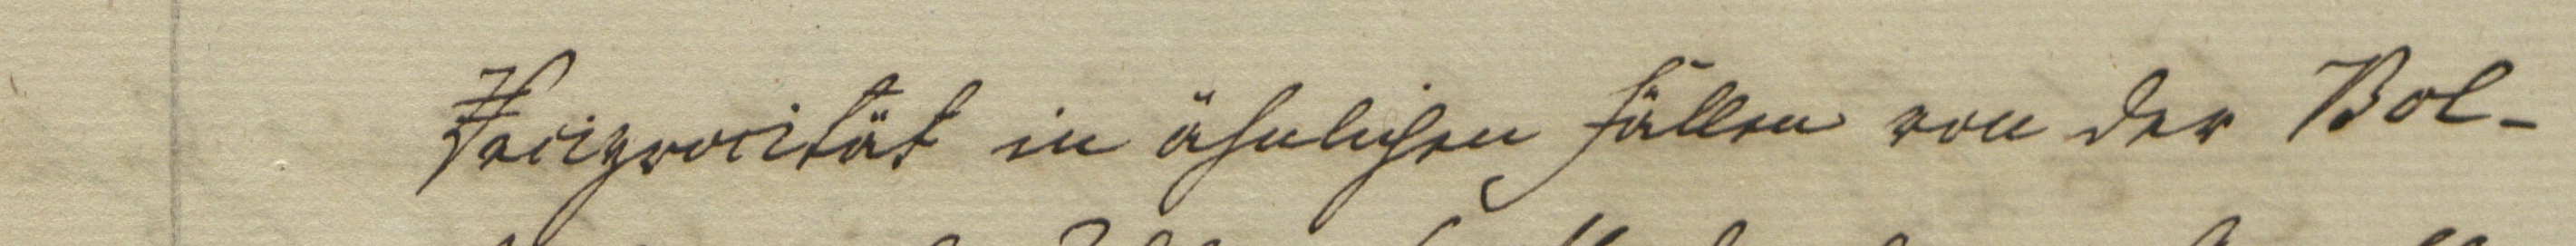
Reciprocität in ähnlichen Fallen von der Bol¬
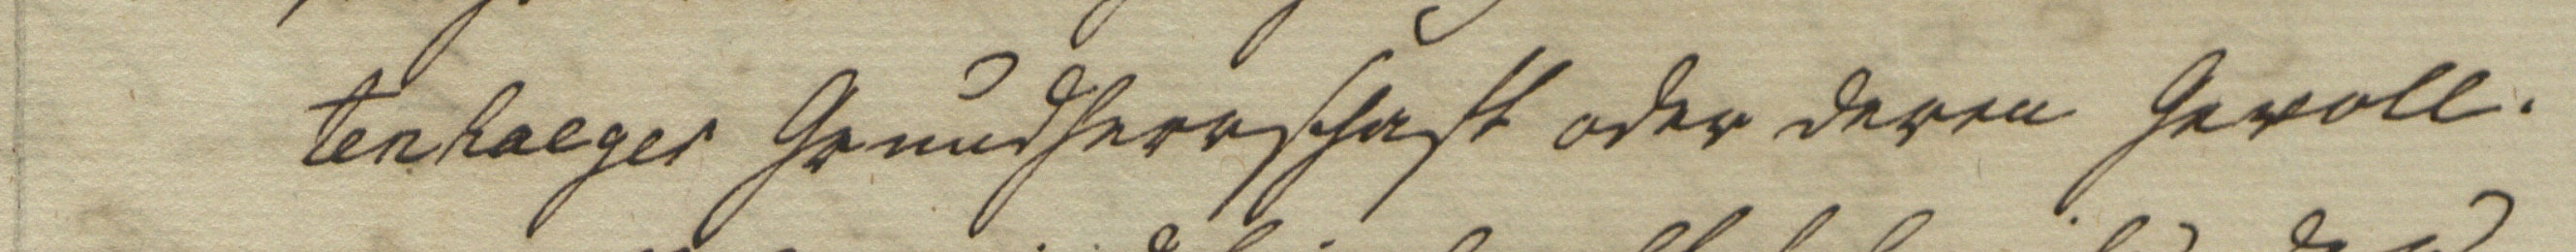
tenhaeger Grundherrschaft oder deren Gevoll¬
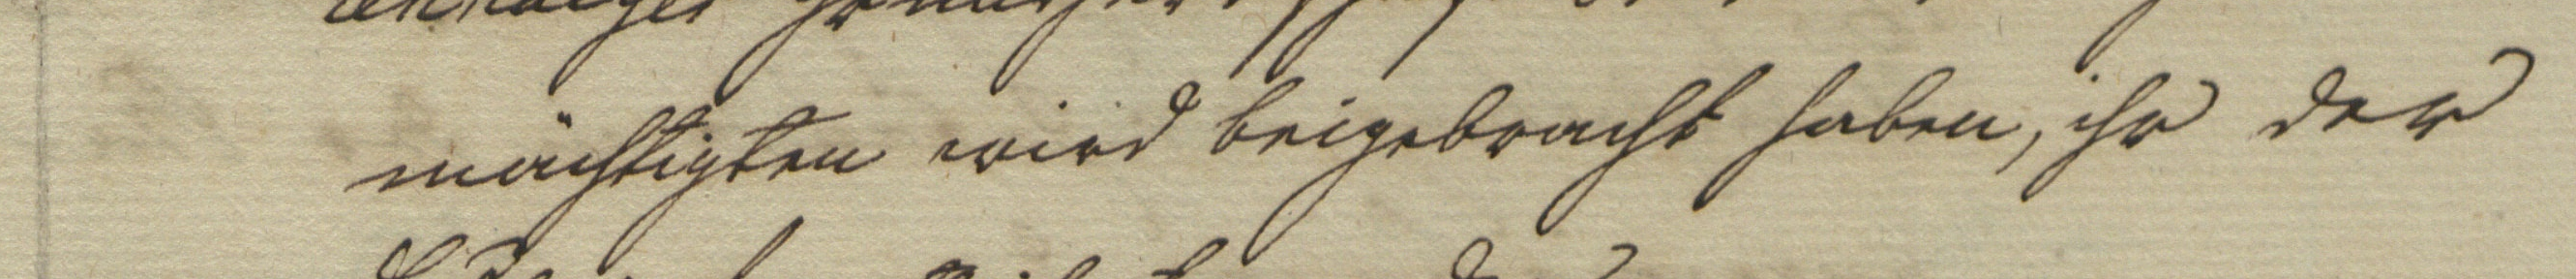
mächtigten wird beigebraucht haben, ihr der
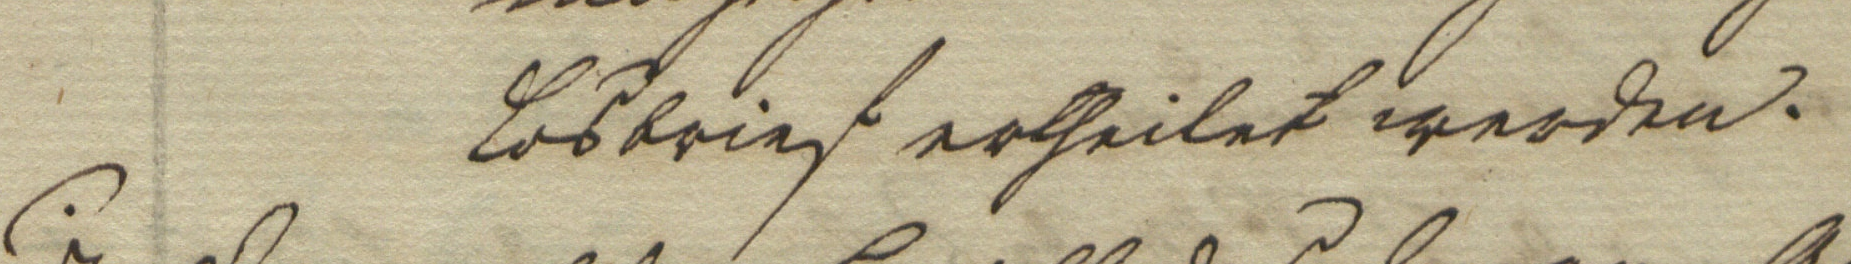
Losbrief ertheilet werden.
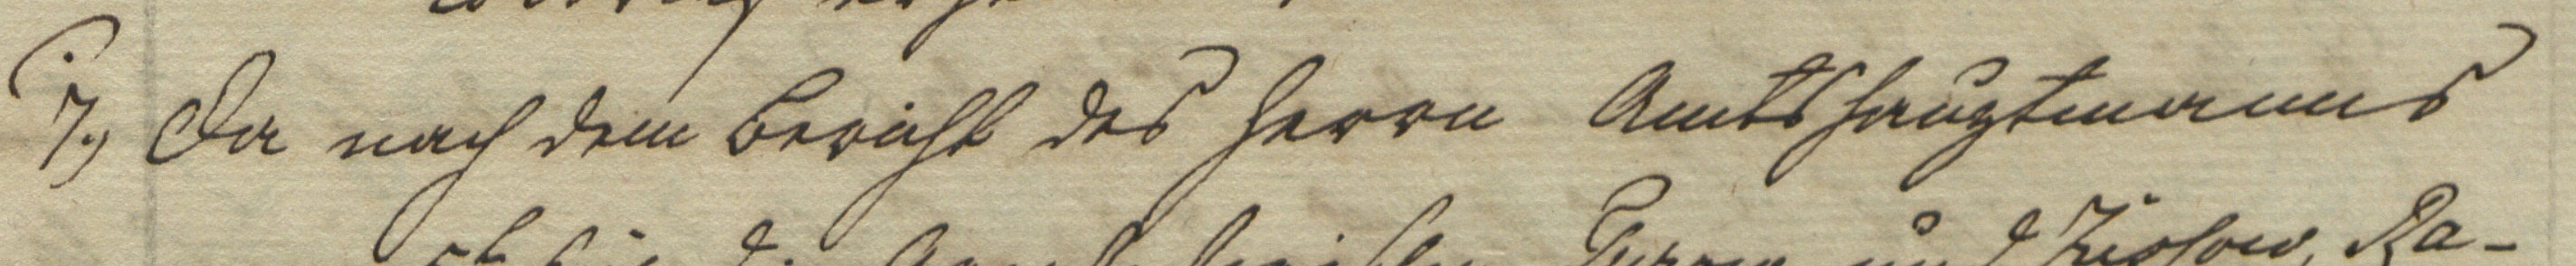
7., Da nach dem Bericht des Herrn Amtshauptmanns
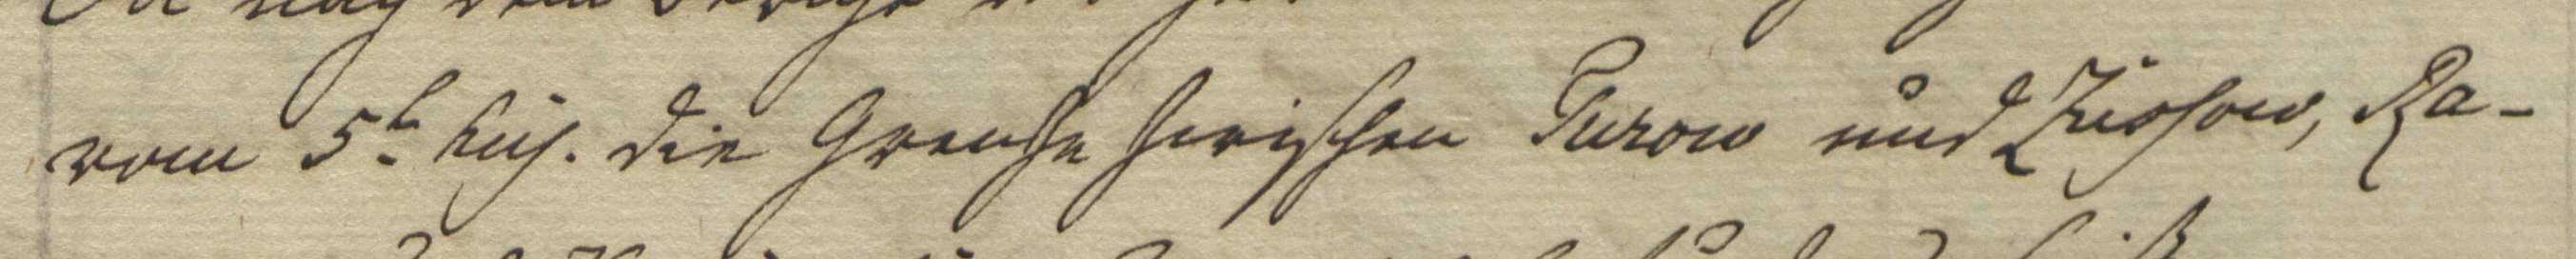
vom 5ten huj. die Grenze zwischen Turow und Züssow, Ra¬
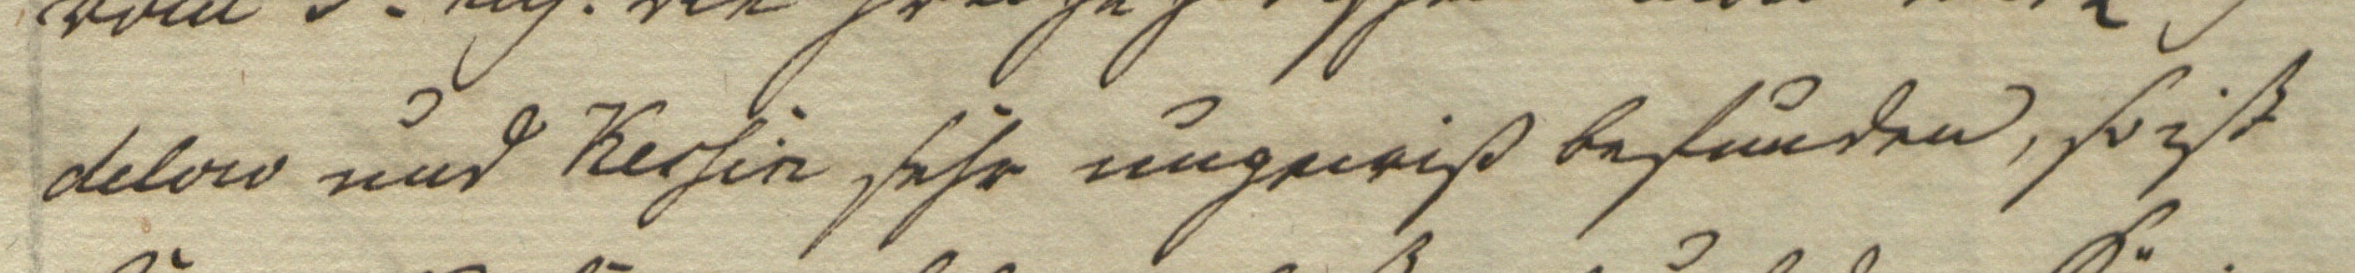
delow und Kessin sehr ungewiß befunden, so ist
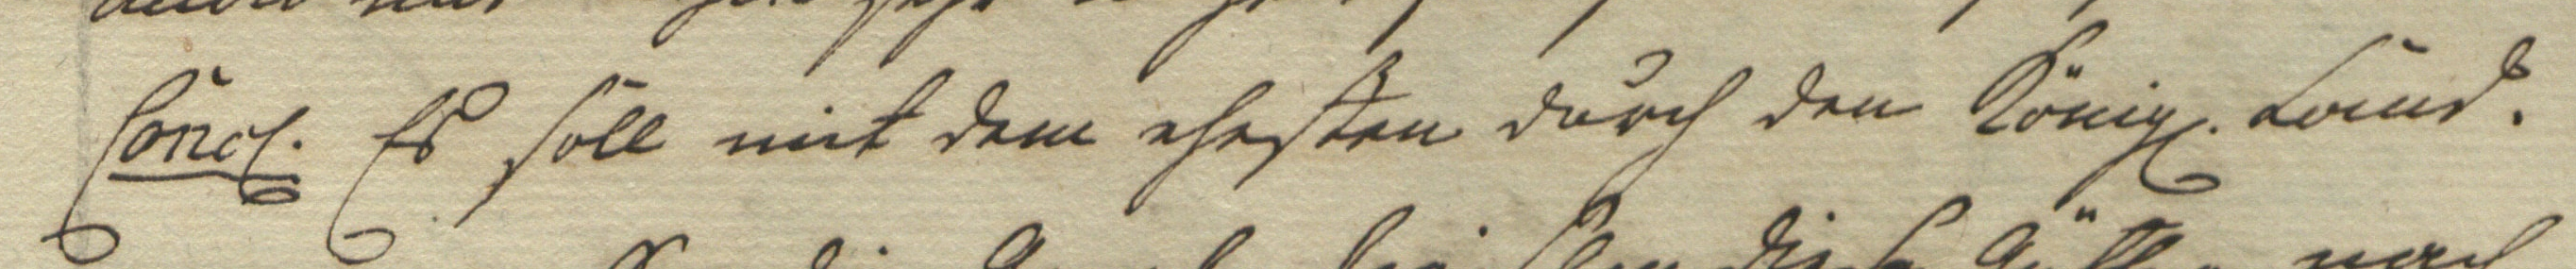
Concl. Es soll mit dem ehesten durch den Königl. Land¬
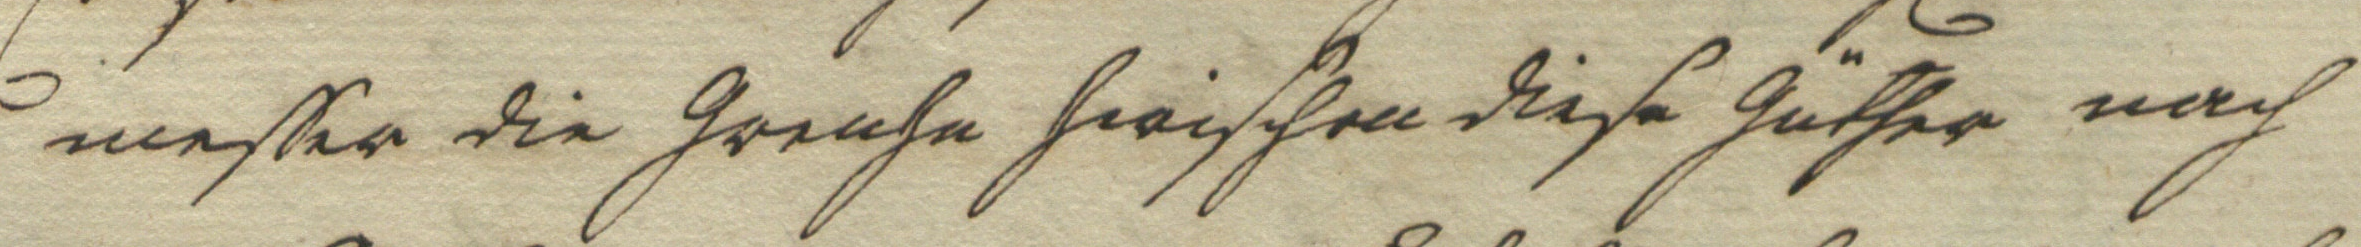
messer die Grenze zwischen diese Güther nach
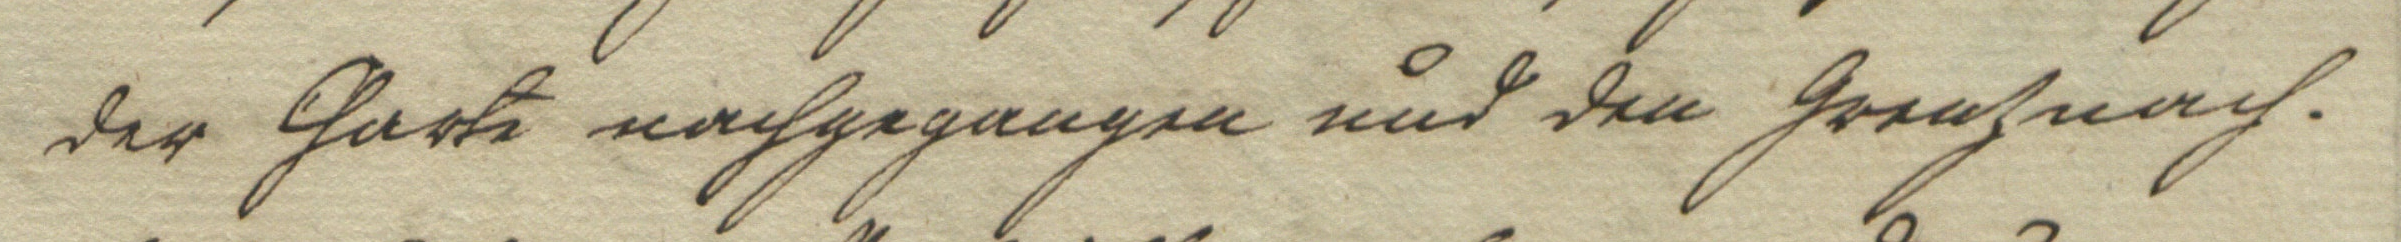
der Charte nachgegangen und den Grenznach¬
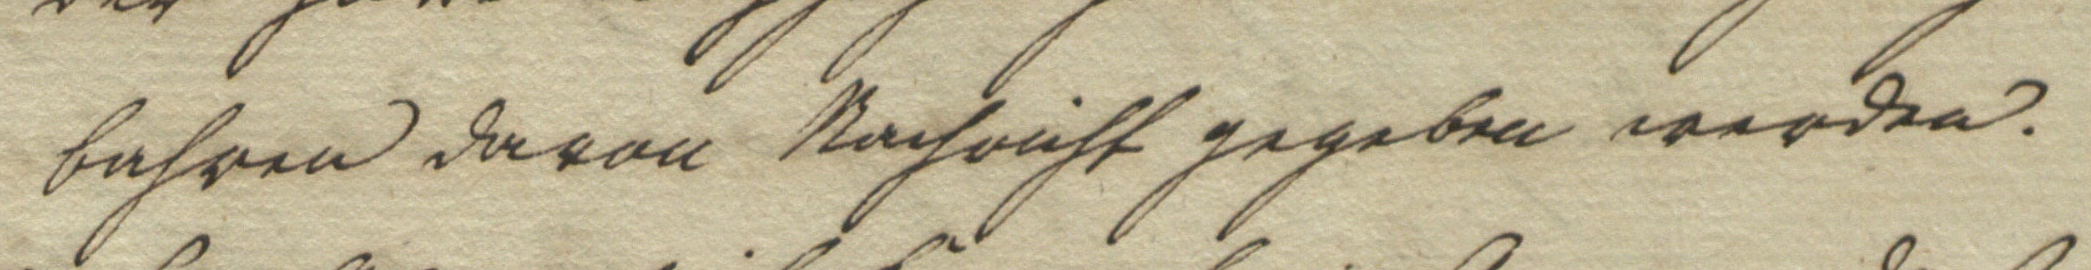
bahren davon Nachricht gegeben werden.
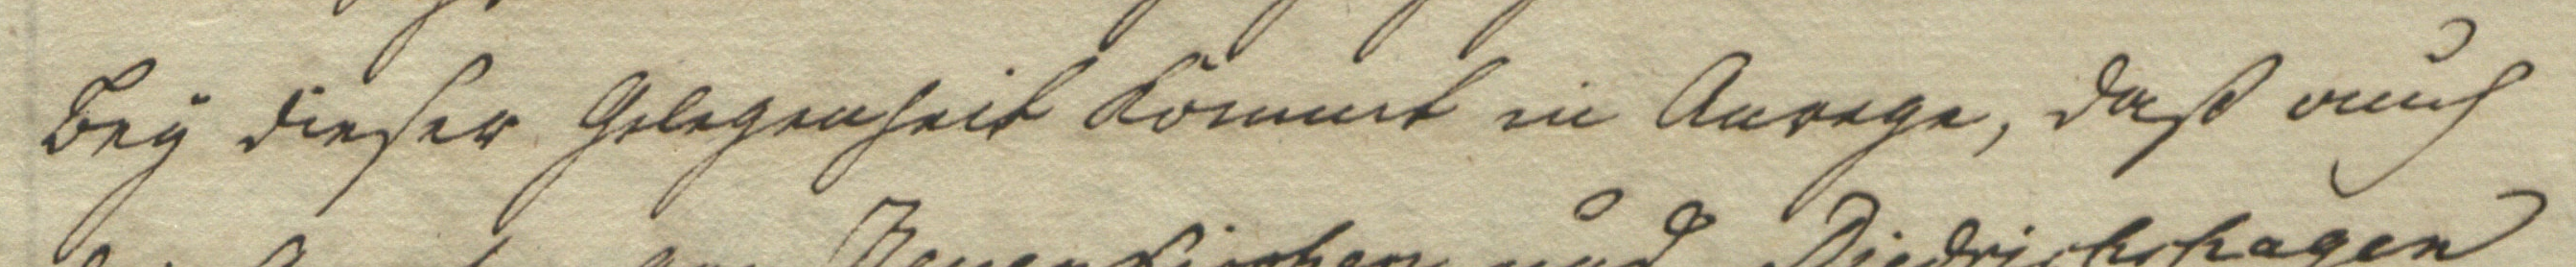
Bey dieser Gelegenheit kommt in Anrege, daß auch
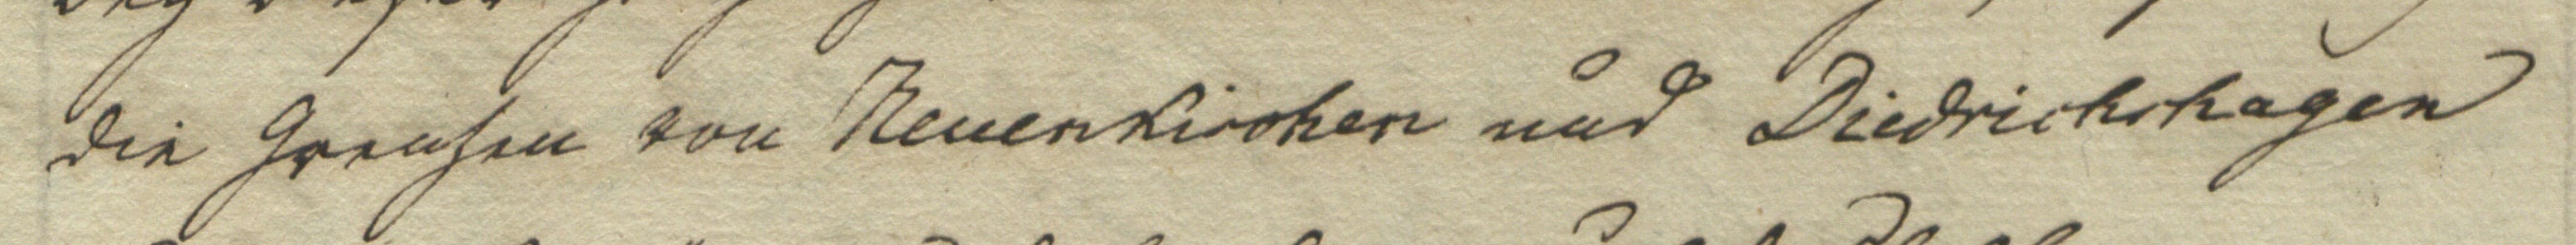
die Grenzen von Neuenkirchen und Diedrichshagen
